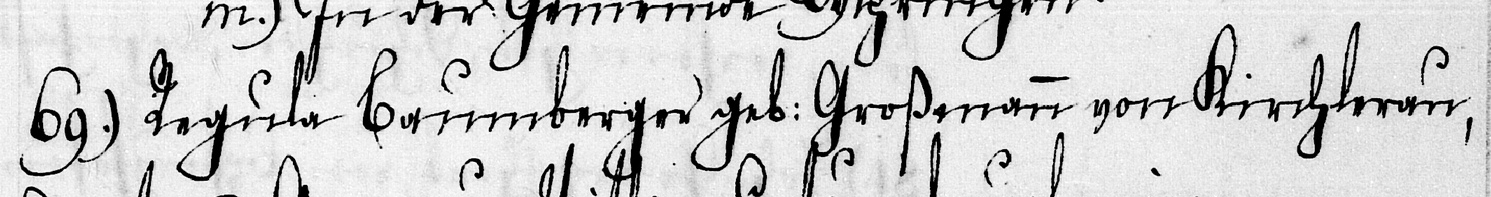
69.) Regula Baumberger geb: Großmann von Kirchlerau,
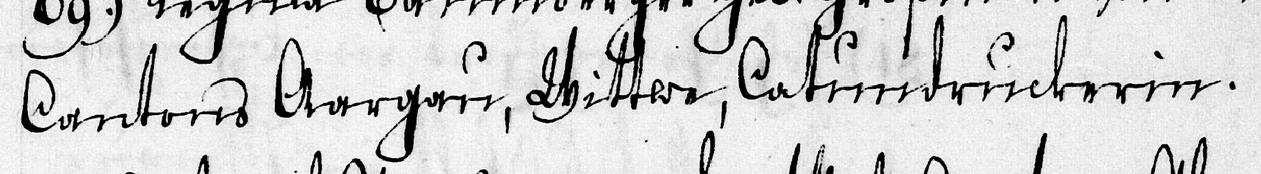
Cantons Aargau, Wittwe, Catundruckerin.
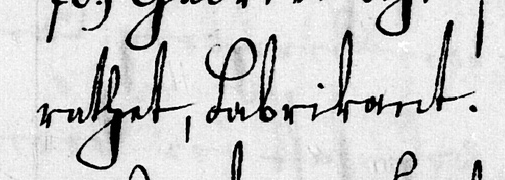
rathet, Fabrikant.
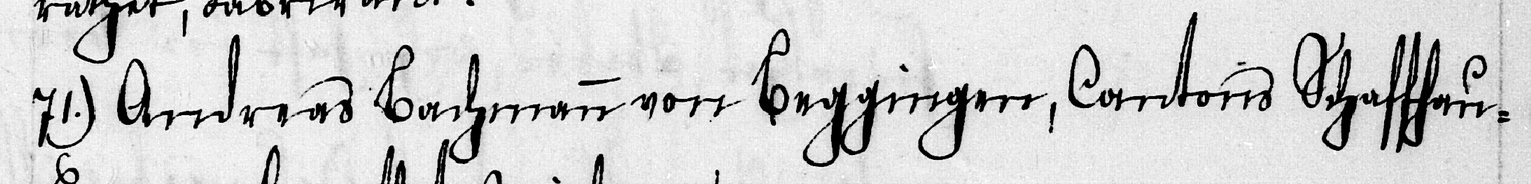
71.) Andreas Bachmann von Beggingen, Cantons Schaffhau¬
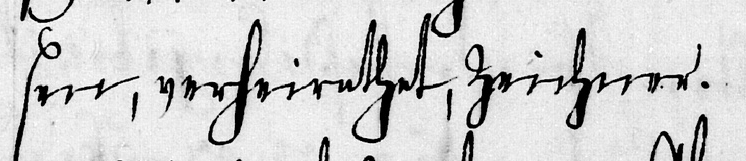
sen, verheirathet, Zeichner.
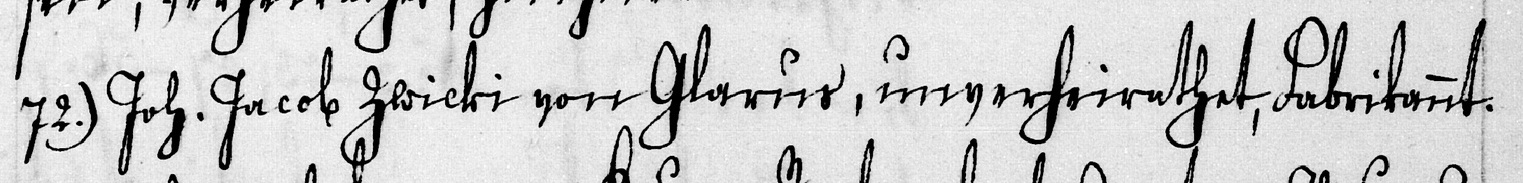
72.) Joh. Jacob Zwicki von Glarus, unverheirathet, Fabrikannt.
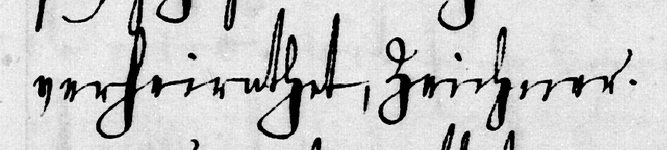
verheirathet, Zeichner.
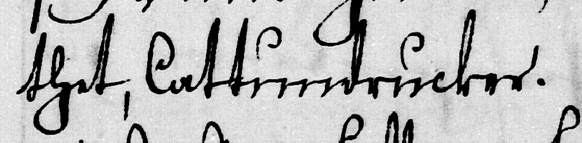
thet, Cattundrucker.
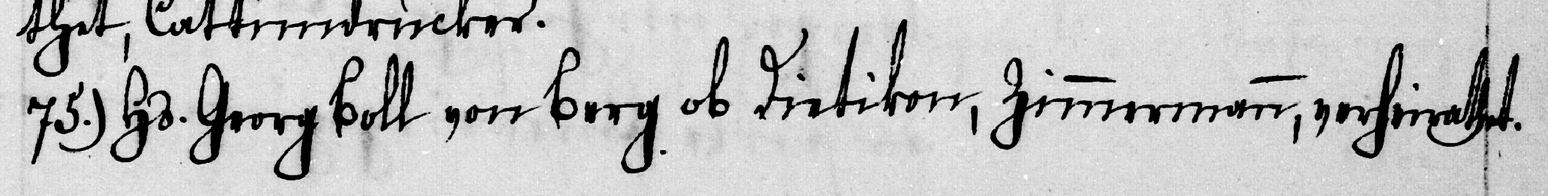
75.) Hs. Georg Boll von Berg ob Dietikon, Zimmermann, verheirathe¬
